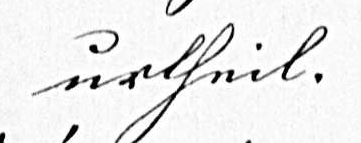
urtheil.
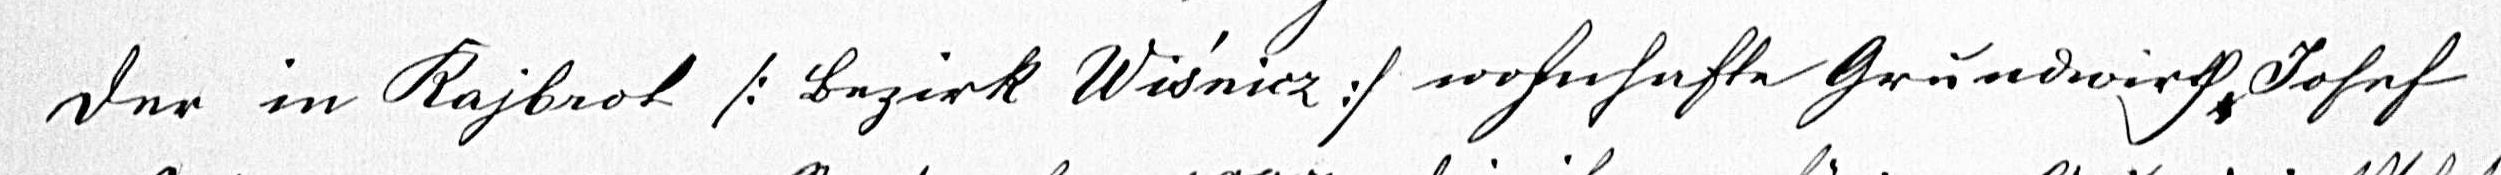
Der in Rajbrot /: Bezirk Wiśnicz :/ wohnhafte Grundwirth Josef
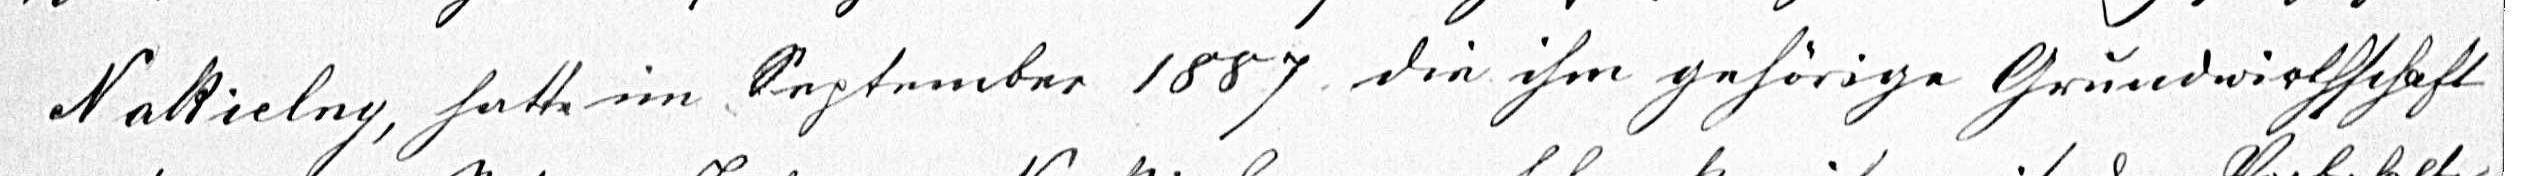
Nakielny, hatte im September 1887 die ihm gehörige Grundwirthschaft
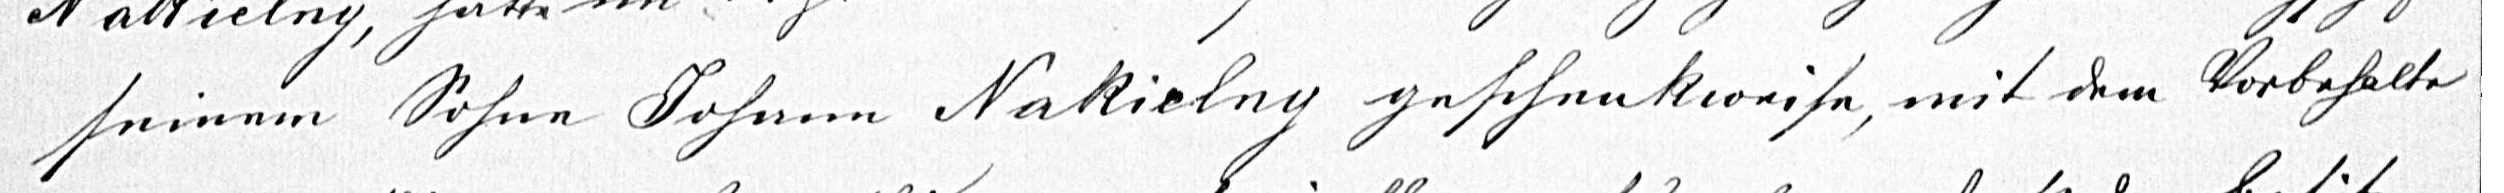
seinem Sohne Johann Nakielny geschenkweise, mit dem Vorbehalte
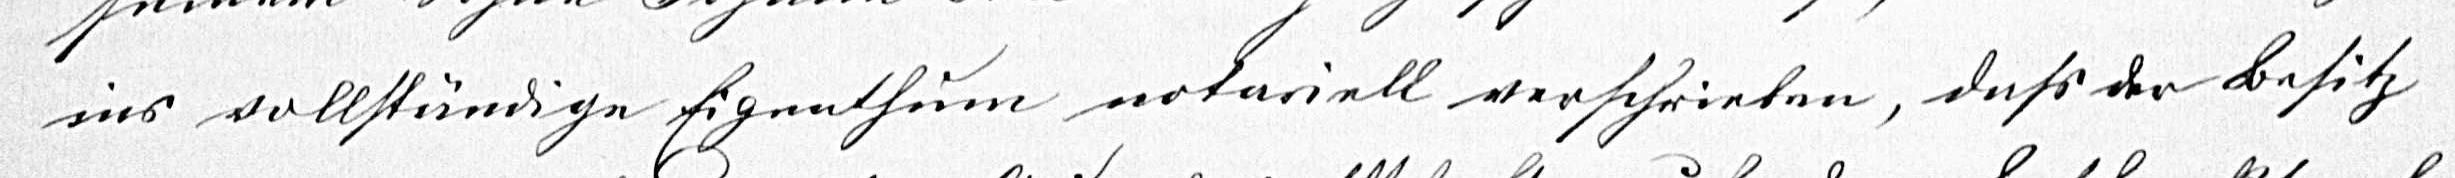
ins vollständige Eigenthum notariell verschrieben, daß der Besitz
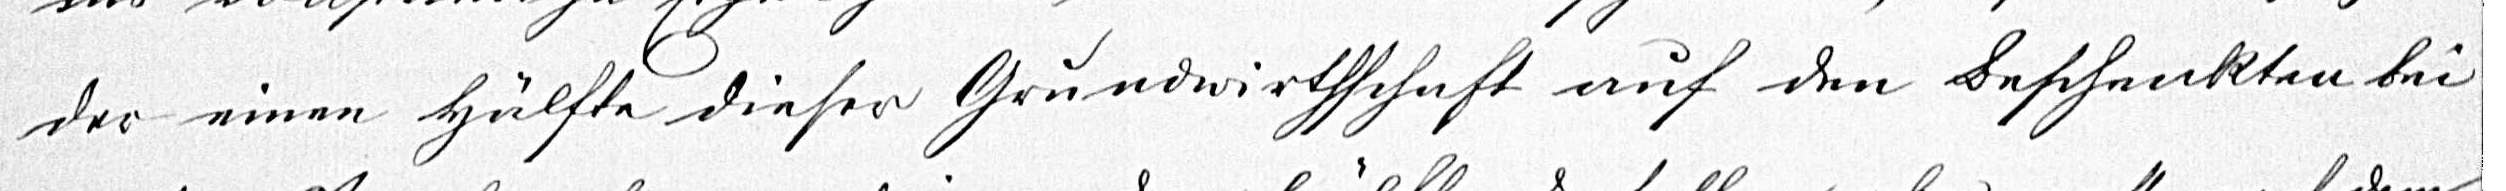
der einen Hülfte dieser Grundwirthschaft auf den Beschenkten bei
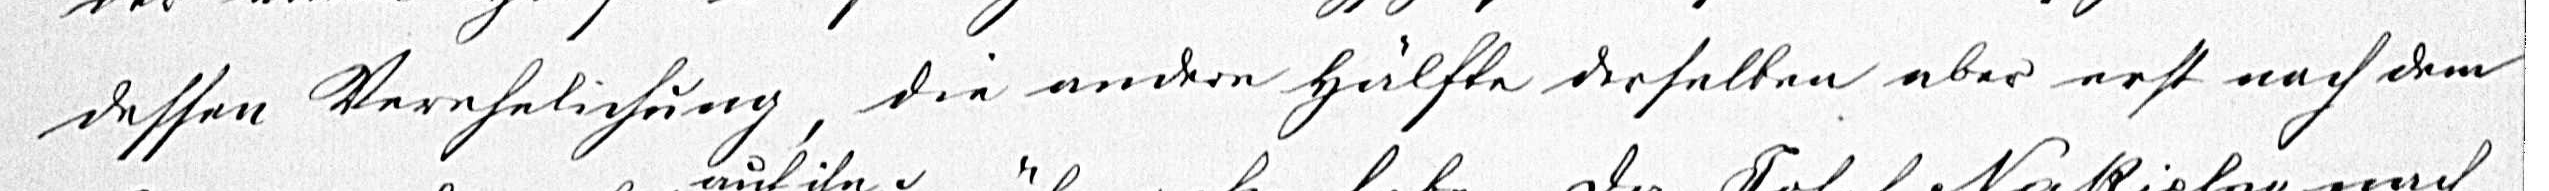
dessen Verehelichung, die andere Hälfte derselben aber erst nach dem
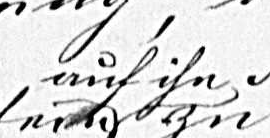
auf ihn
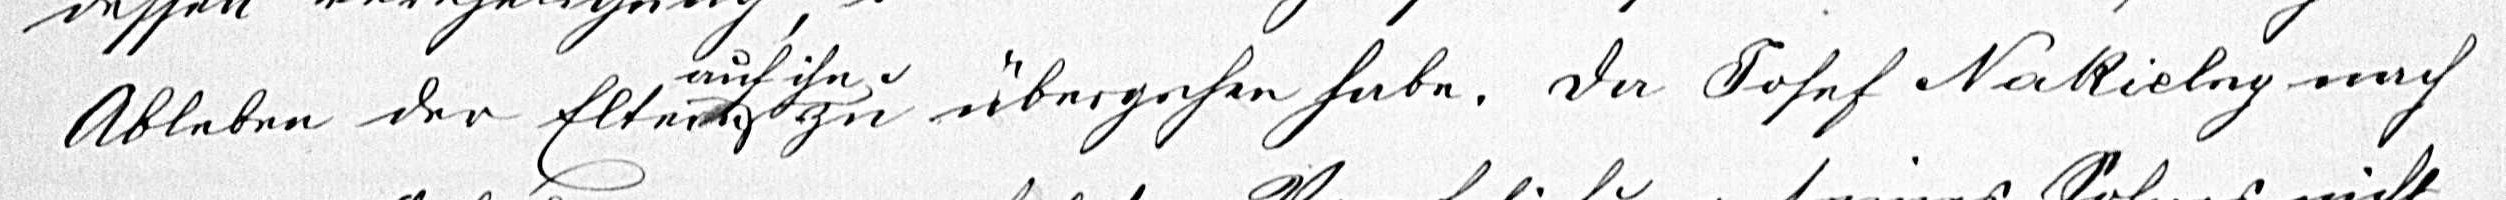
Ableben der Eltern zu überxxchen habe. Da Josef Nakielny nach
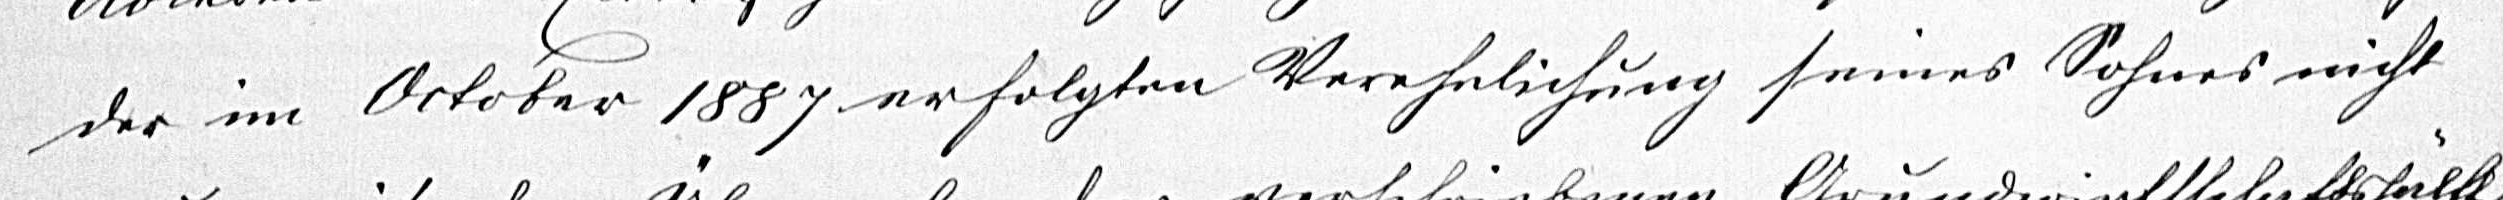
der im October 1887 erfolgten Verehelichung seines Sohnes nicht
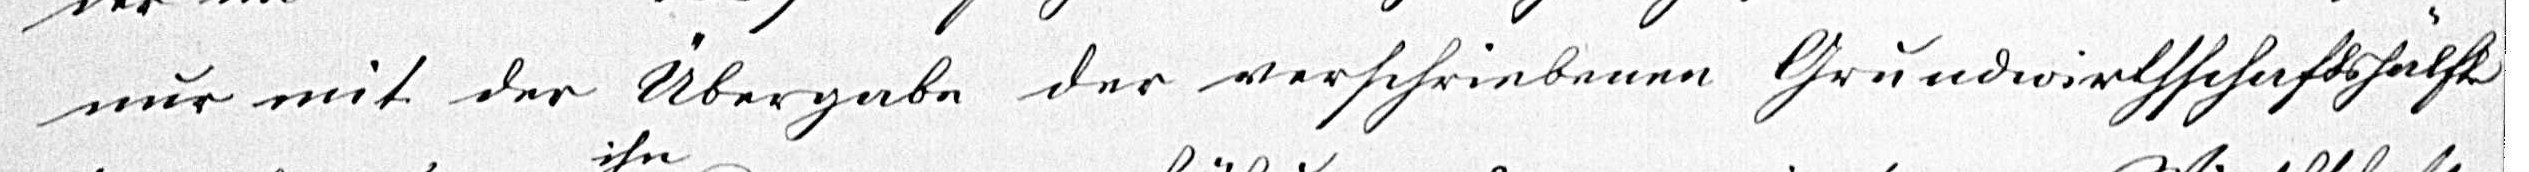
nur mit der Übergabe der verschriebenen Grundwirthschaftshälfte
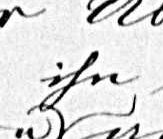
ihm
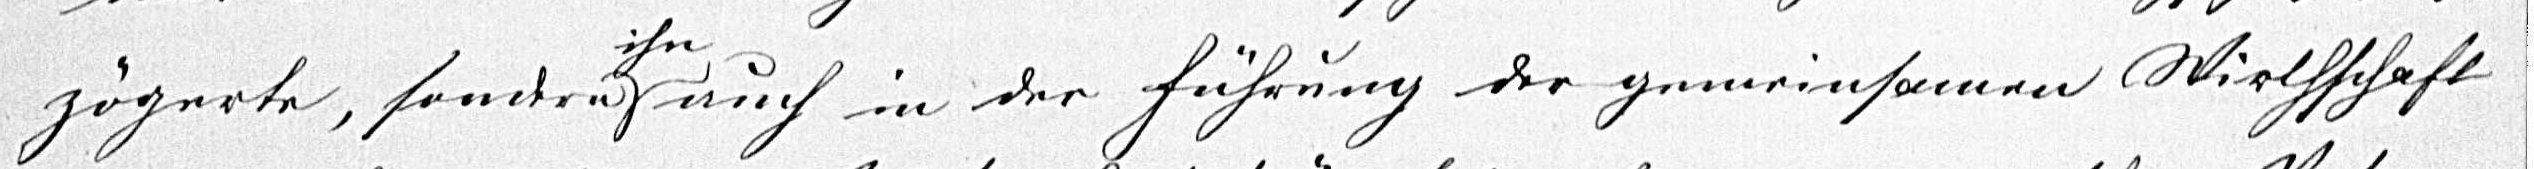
zögerte, sondern auch in der Führung der gemeinsamen Wirthschaft
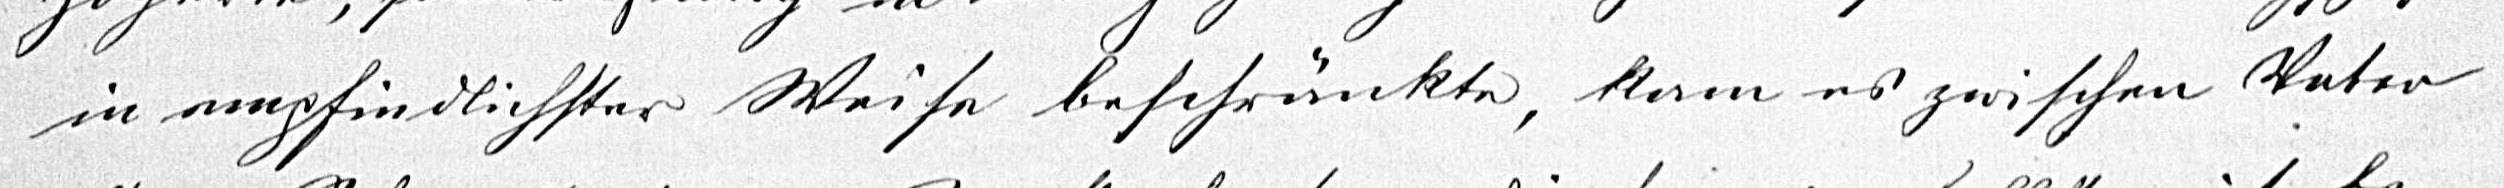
in empfindlichster Weise beschränkte, kam es zwischen Vater
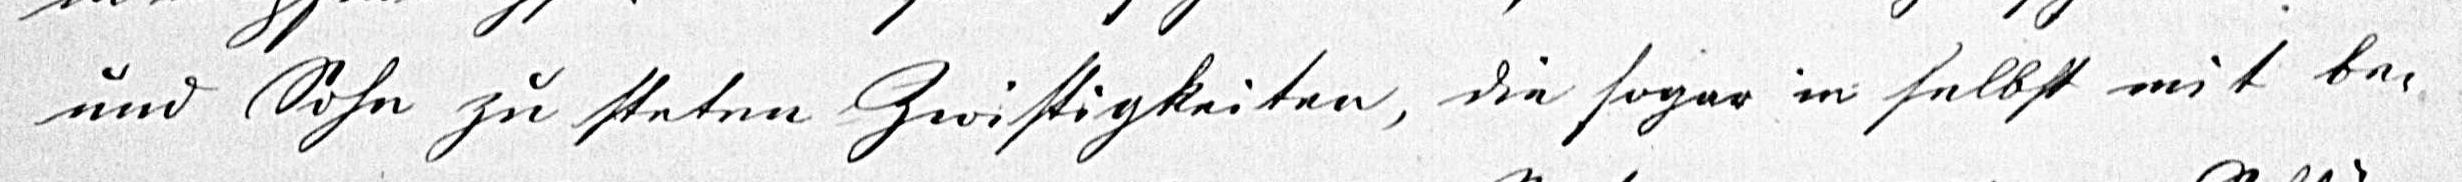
und Sohn zu steten Zwistigkeiten, die sogar in selbst mitbe¬
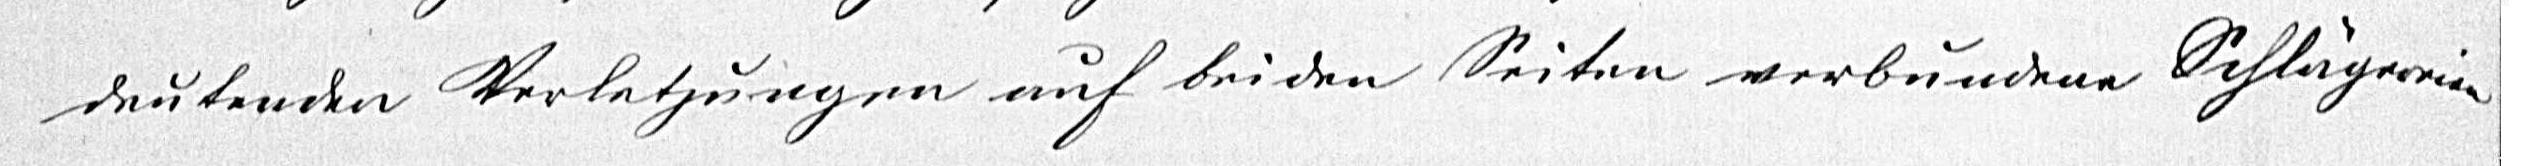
deutenden Verletzungen auf beiden Seiten verbundene Schlägereien
